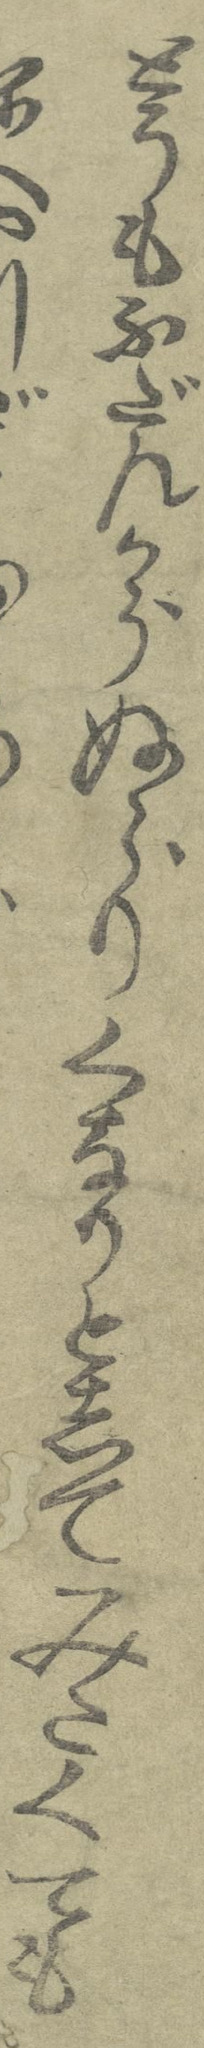〽どうもふだんからぬらりくなりとしてみたくても
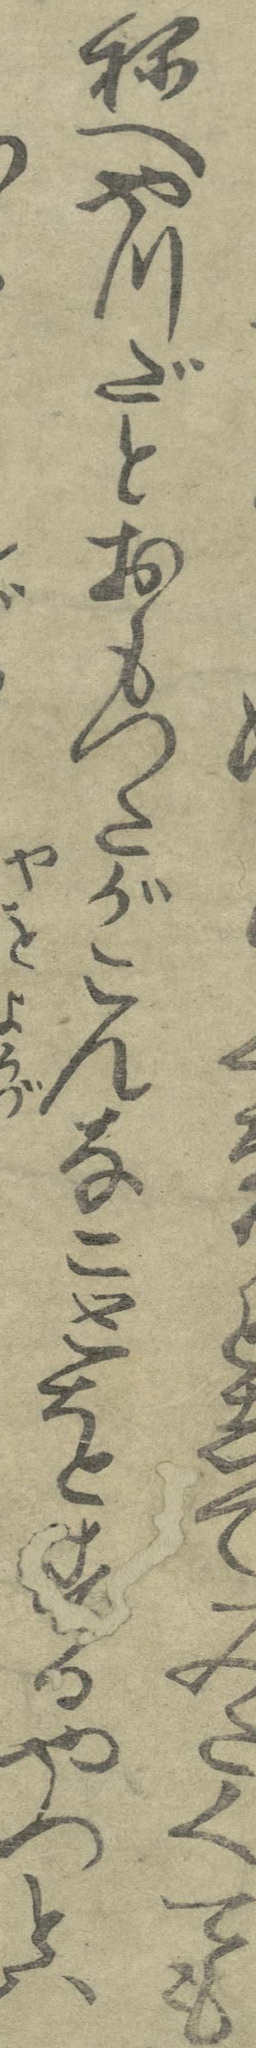ねへやつだとおもつたがこんなことをするやつとは
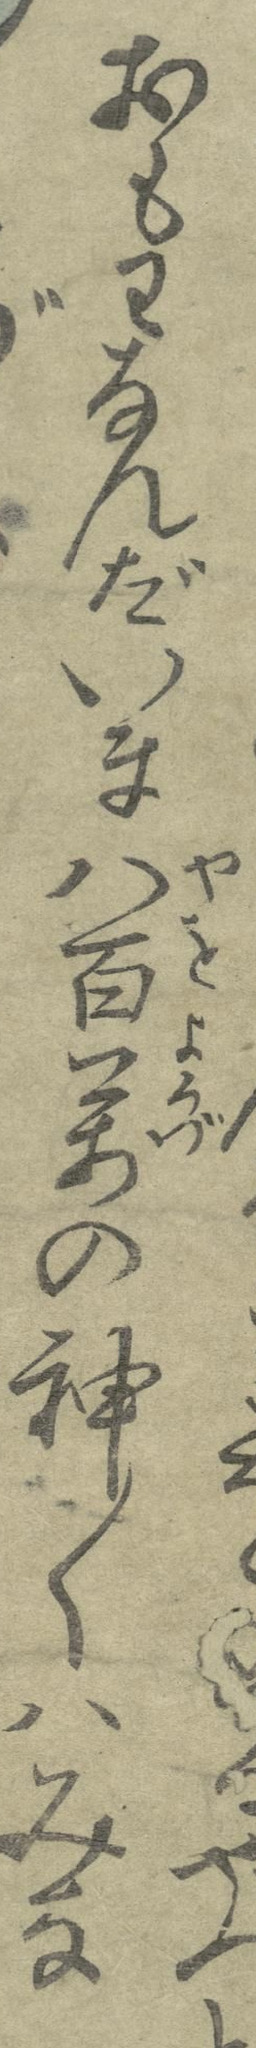おもわなんだいま八百萬の神〳〵はみな
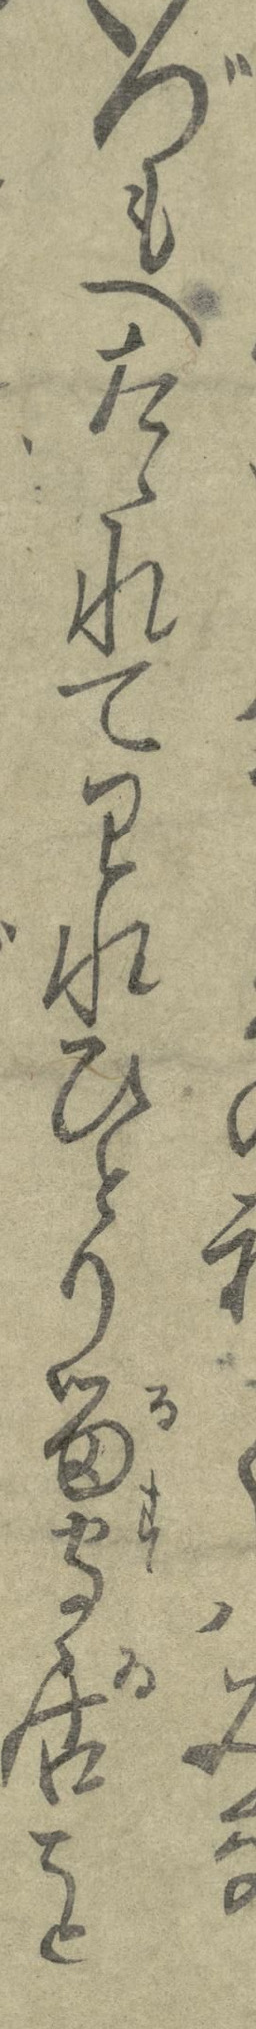いづもへたゝれてわれひとり留守居を
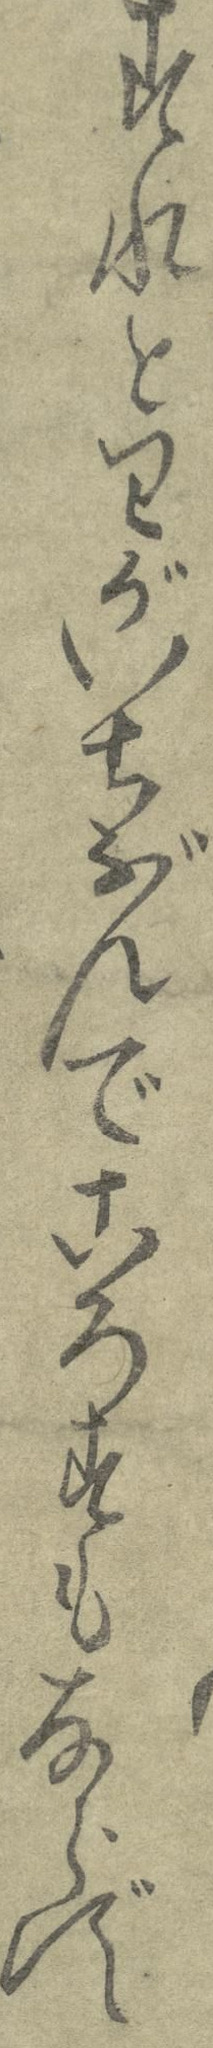すれどわがいちぶんでころすもならず
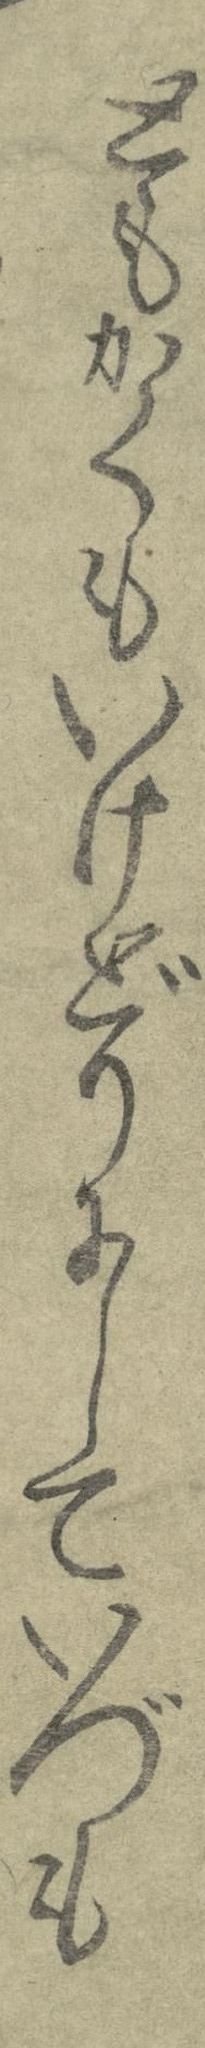ともかくもいけどりにしていづも
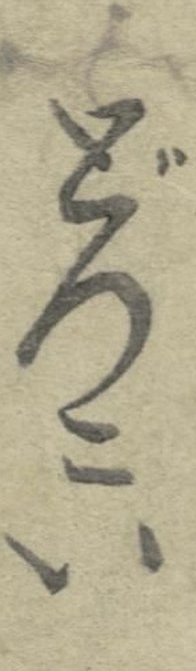どつこい
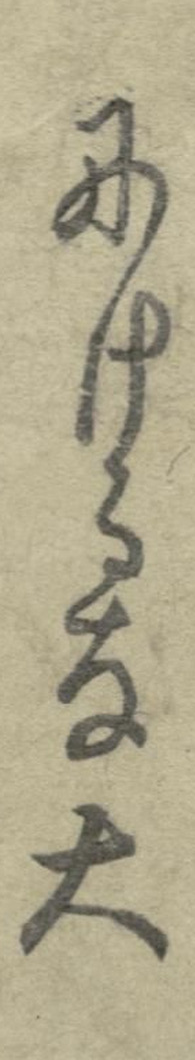にけるな大
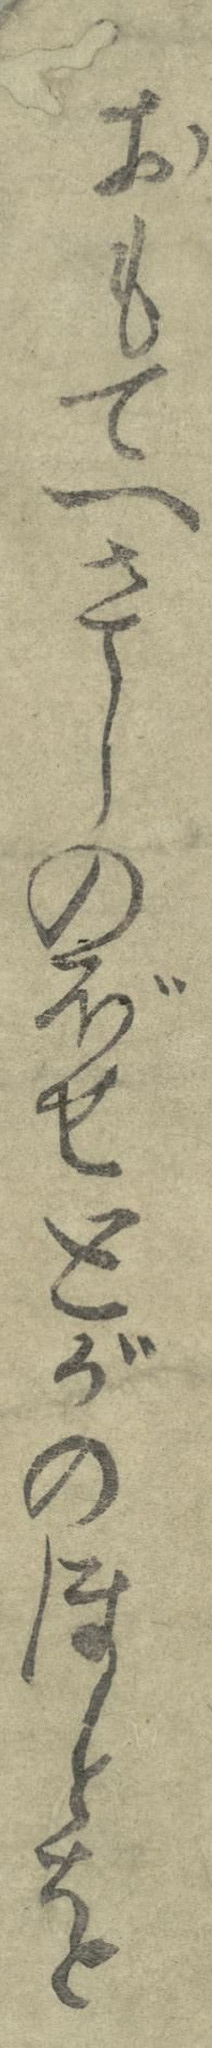おもてへさしのぼせとがのほとを
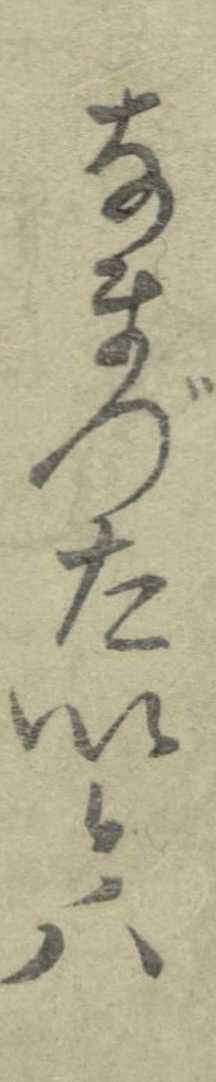なまづたいとは
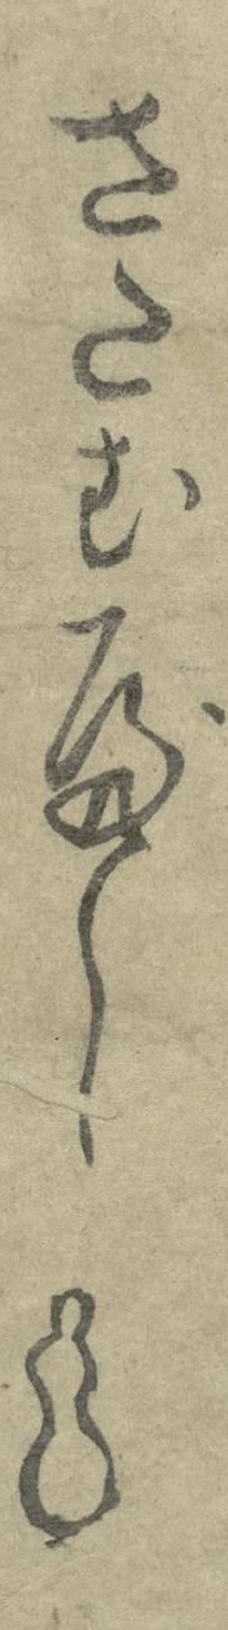さたむべし
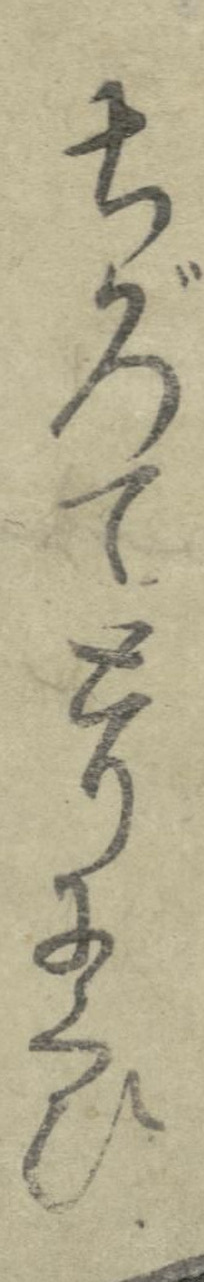ちがつてとりにくひ
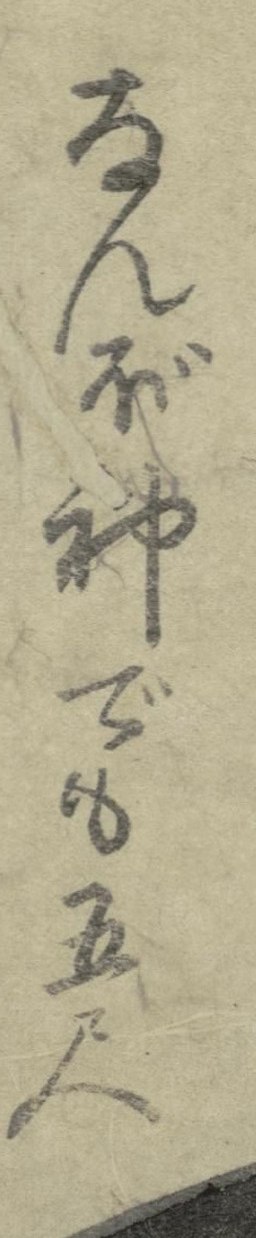なんぼ神でも五尺
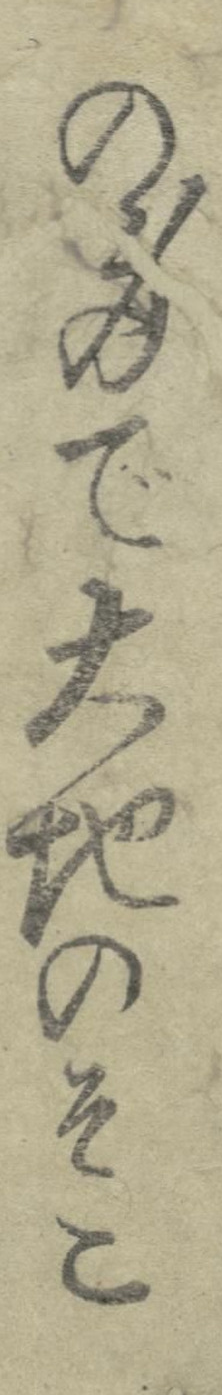の身で大地のそこ
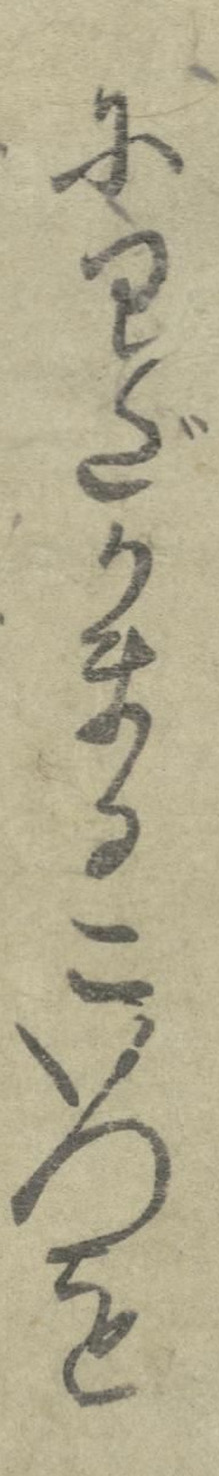にわだかまるこいつを
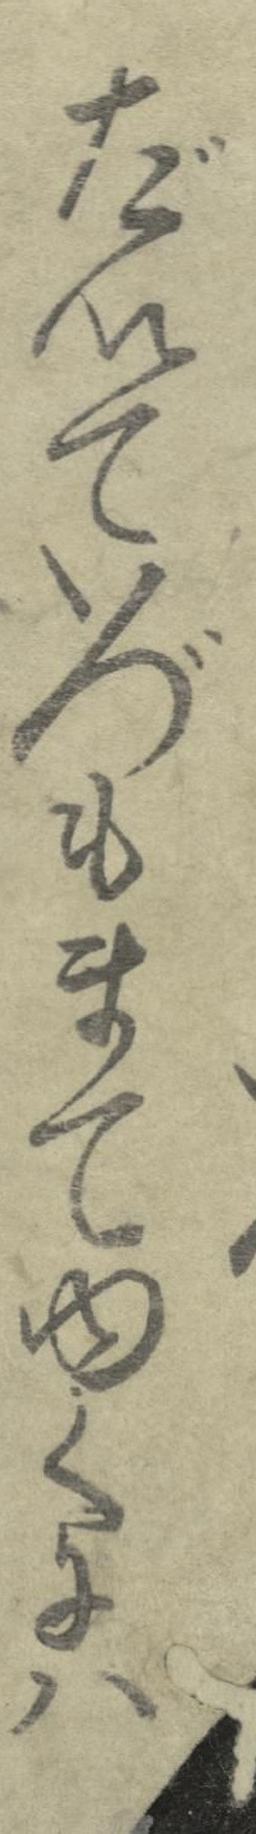だいていづもまてゆくには
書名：[鯰をおさえる恵比寿]
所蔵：東京大学地震研究所図書室 Earthquake Research Institute Library, The University of Tokyo, JAPAN
